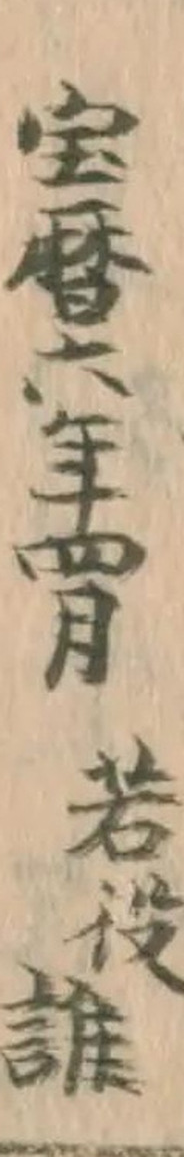宝暦六年四月若役誰
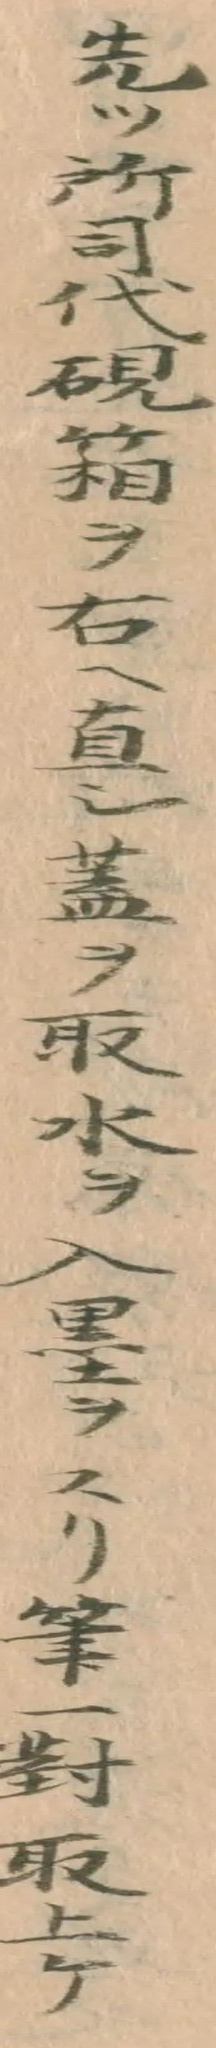先ツ所司代硯箱ヲ右へ直シ蓋ヲ取水ヲ入墨ヲスリ筆一對取上ケ
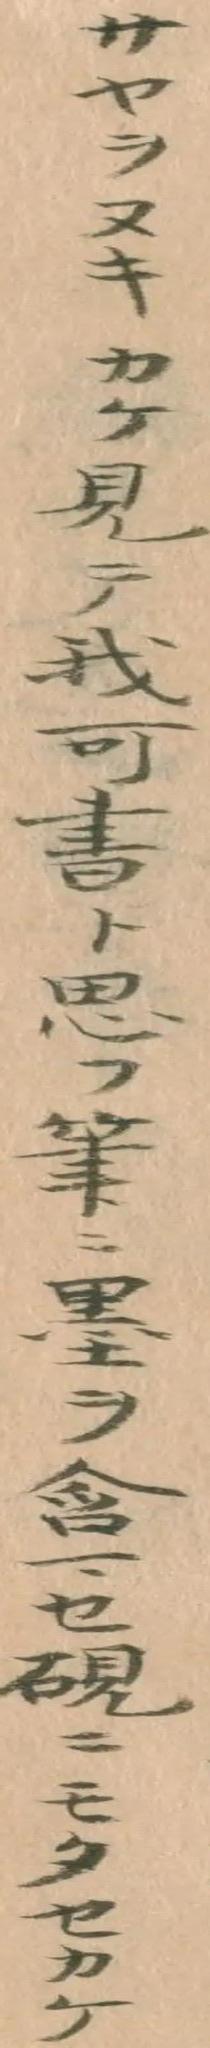サヤラヌキカケ見テ我可書ト思フ筆ニ墨ヲ含マセ硯ニモタセカケ
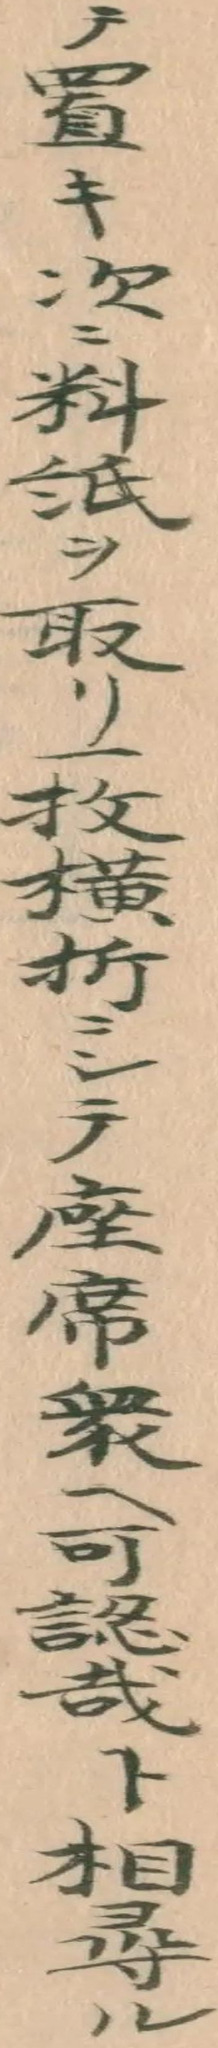テ置キ次ニ料紙ヲ取リ一枚横折ニシテ座席衆ヘ可認哉ト相尋ル
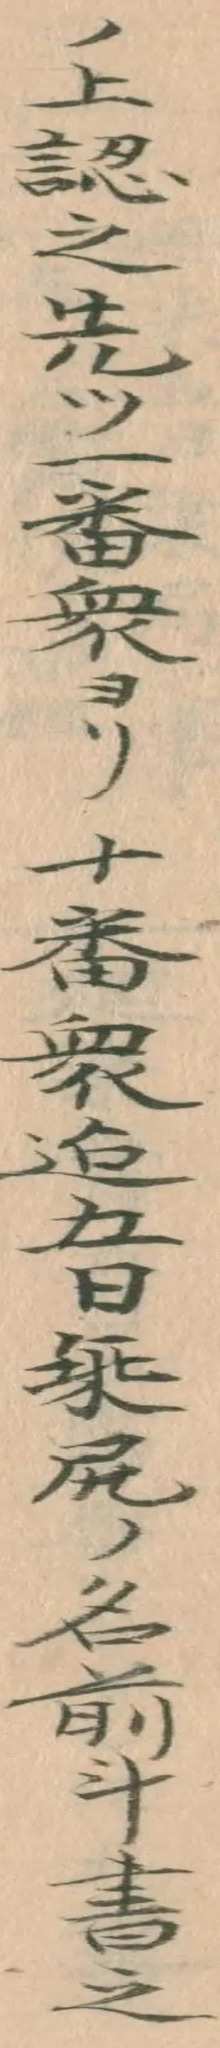ノ上認之先ツ一番衆ヨリ十番衆迄五日乗尻ノ名前斗書之
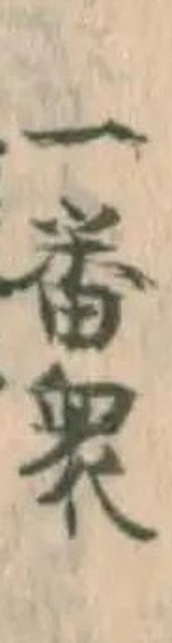一番衆
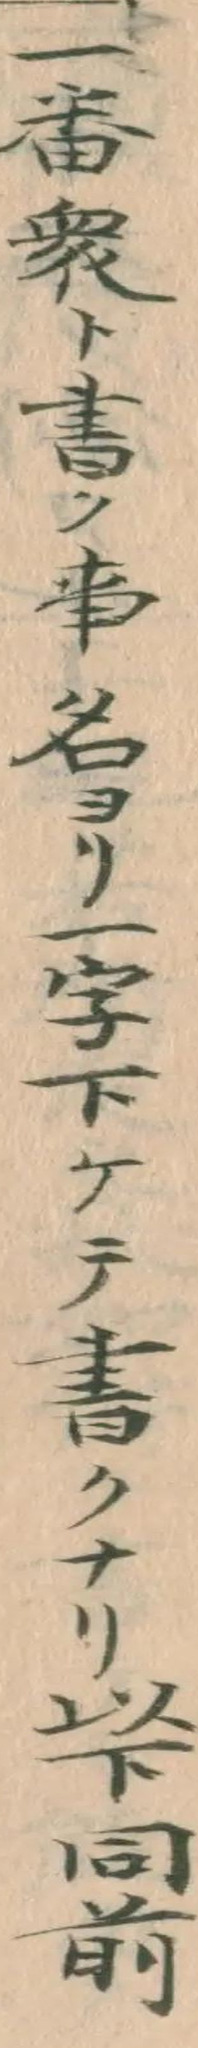一番衆ト書ク事名ヨリ一字下ケテ書クナリ以下同前
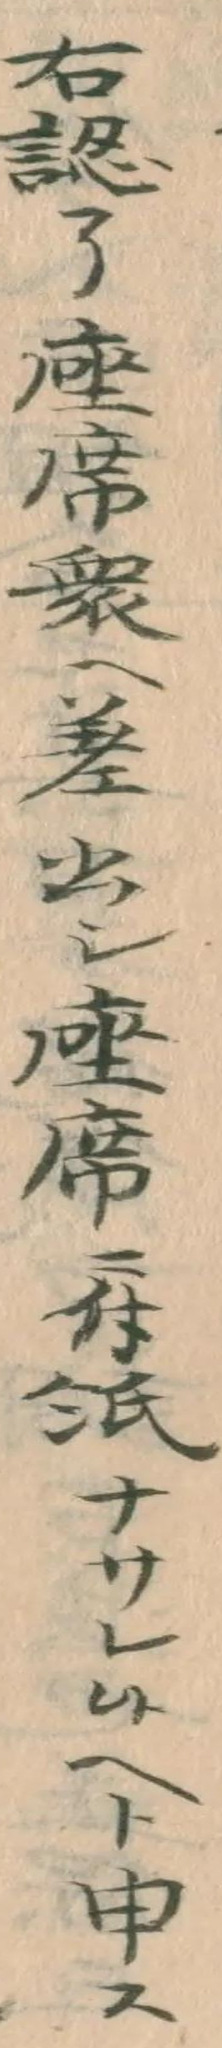右認了座席衆ヘ差出シ座席ニ付紙ナサレ候ヘト申ス
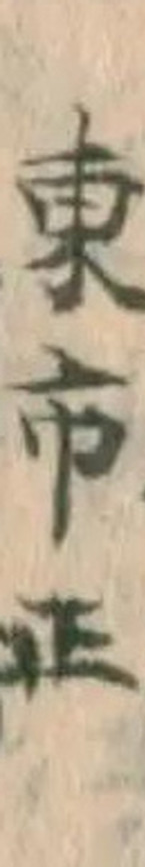東市正
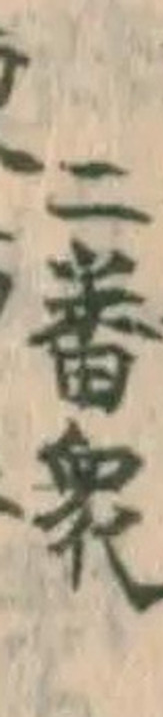二番衆
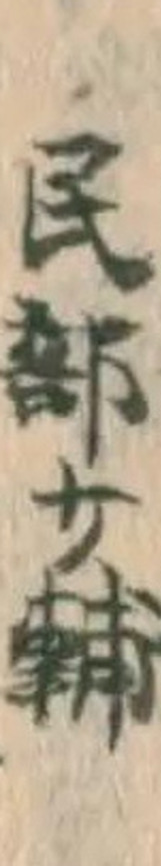民部少輔
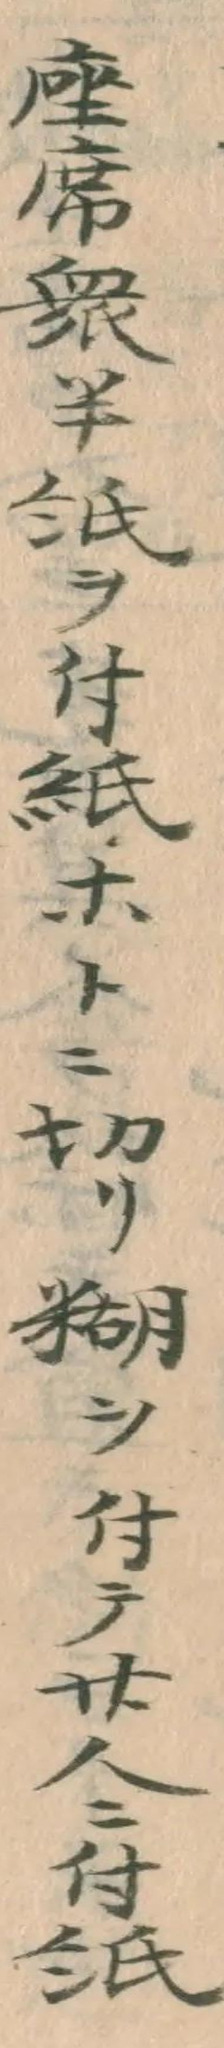座席衆半紙ヲ付紙等トニ切リ糊ヲ付テ廿人ニ付紙
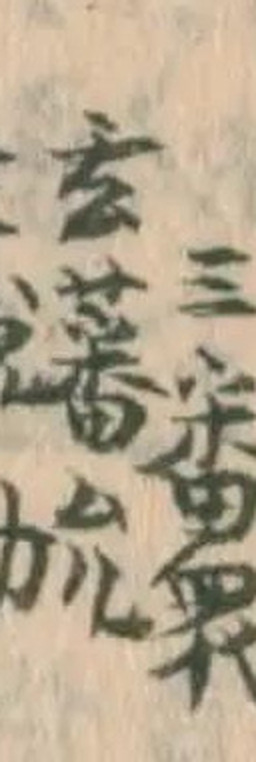玄蕃允
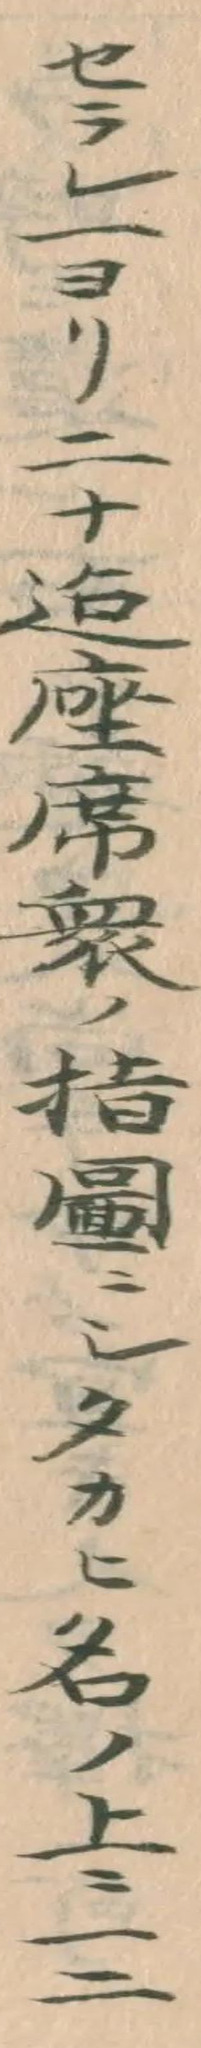セラレ一ヨリ二十迄座席衆ノ指圖ニシタカヒ名ノ上ニ一二
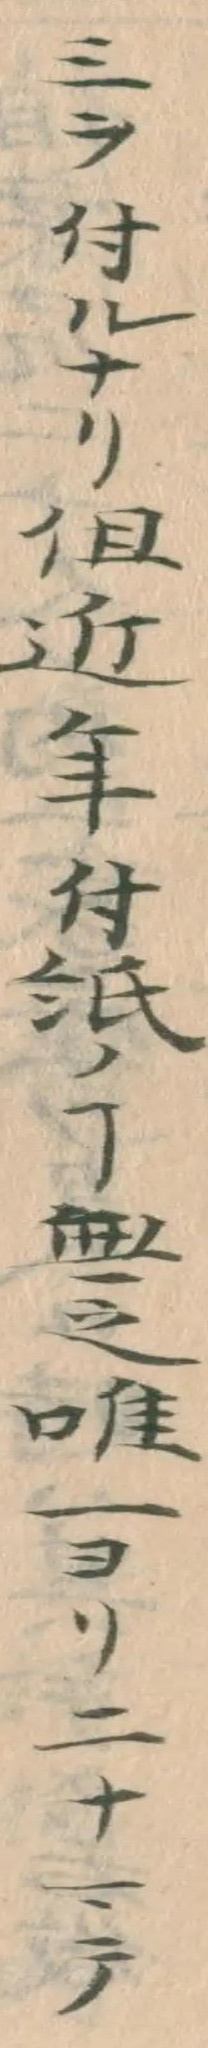三ヲ付ルナリ但近年付紙ノヿ無之唯一ヨリ二十マテ
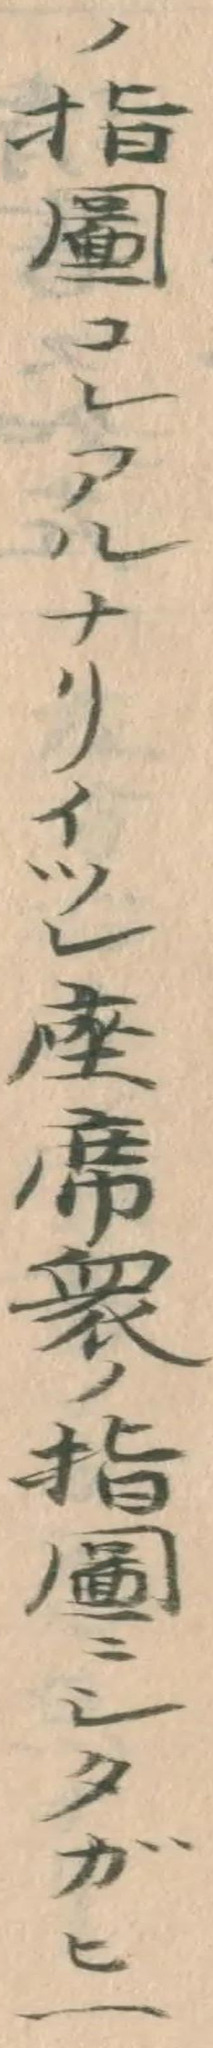ノ指圖コレアルナリイツレ座席衆ノ指圖ニシタガヒ一
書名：賀茂社記録. 第40冊
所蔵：国立国会図書館 National Diet Library, JAPAN
